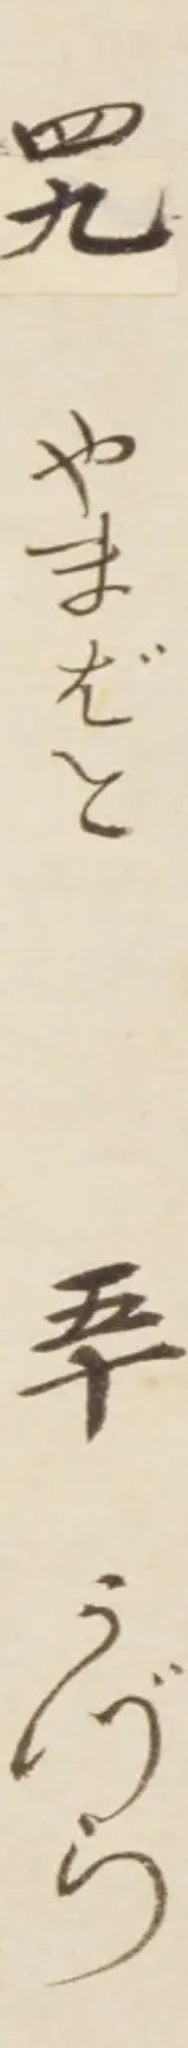四九やまばと五十うづら
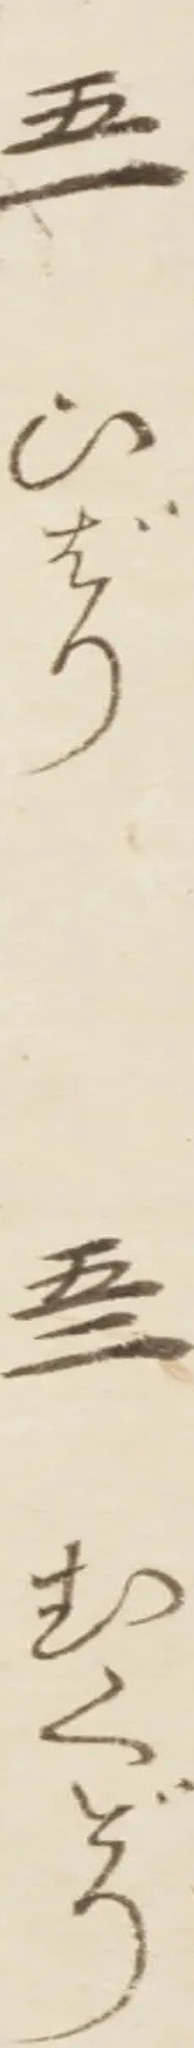五一ひばり五二むくどり
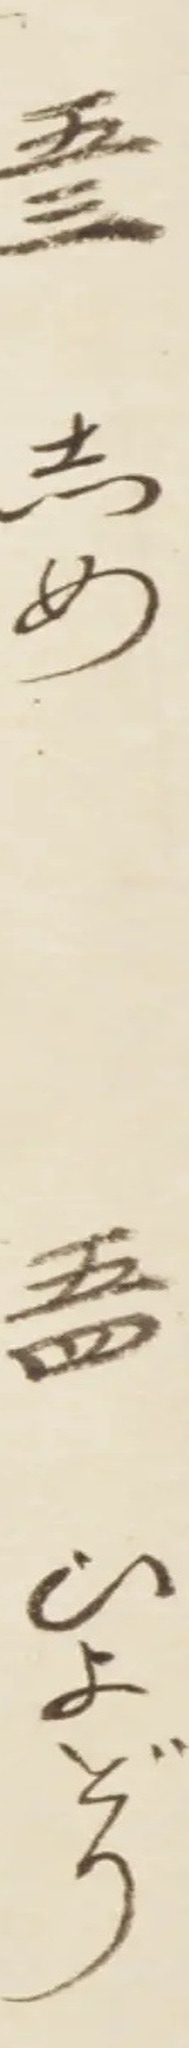五三しめ五四ひよどり
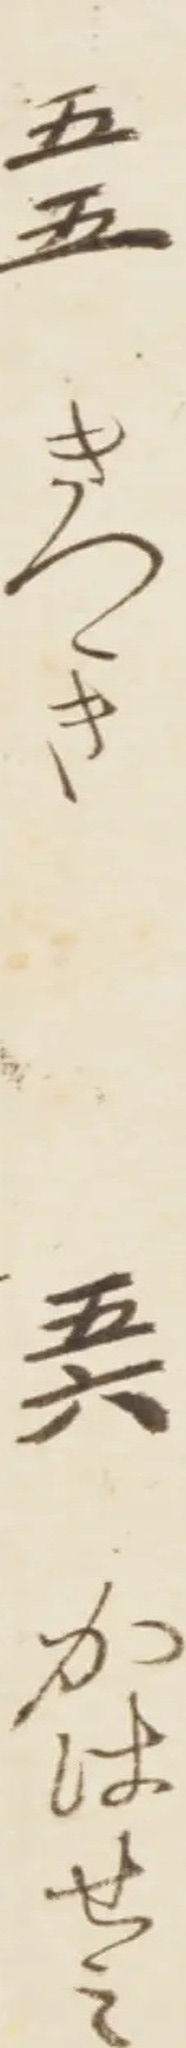五五きつゝき五六かはせみ
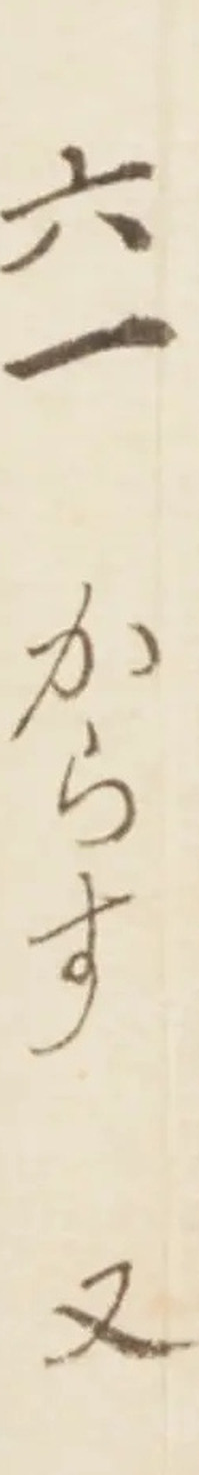六一からす又

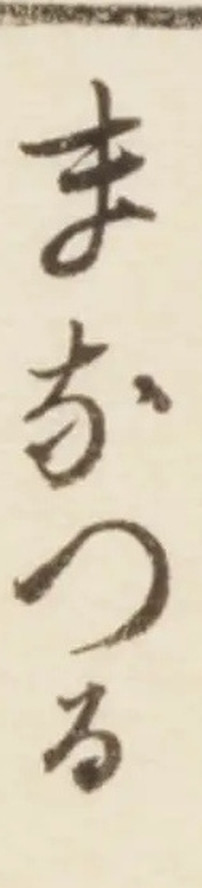まなつる

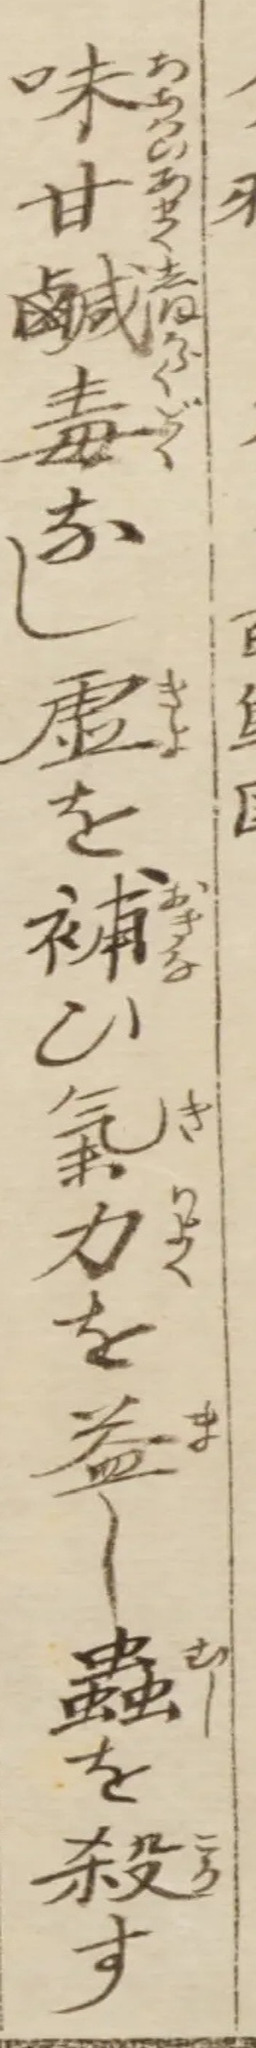味甘鹹毒なし虚を補ひ気力を益し蟲を殺す
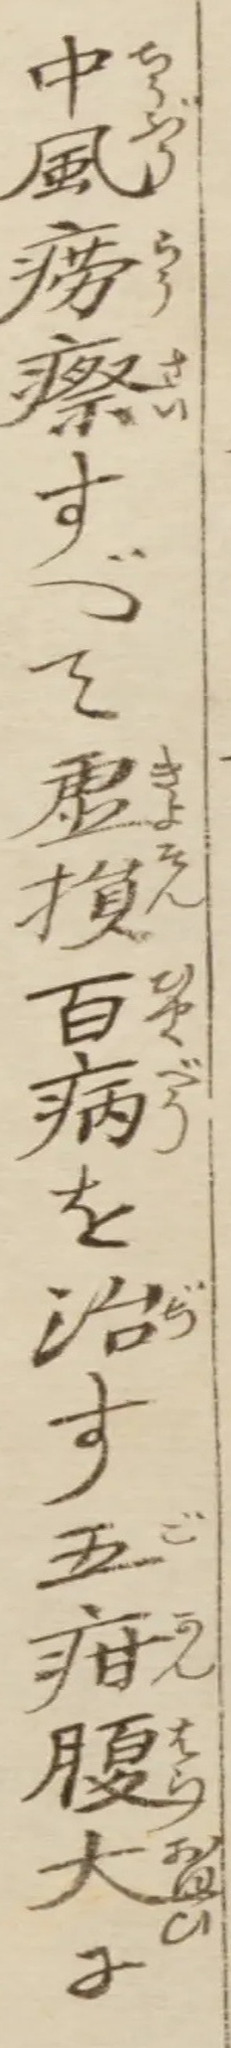中風痨瘵すべて虚損百病を治す五疳腹大に
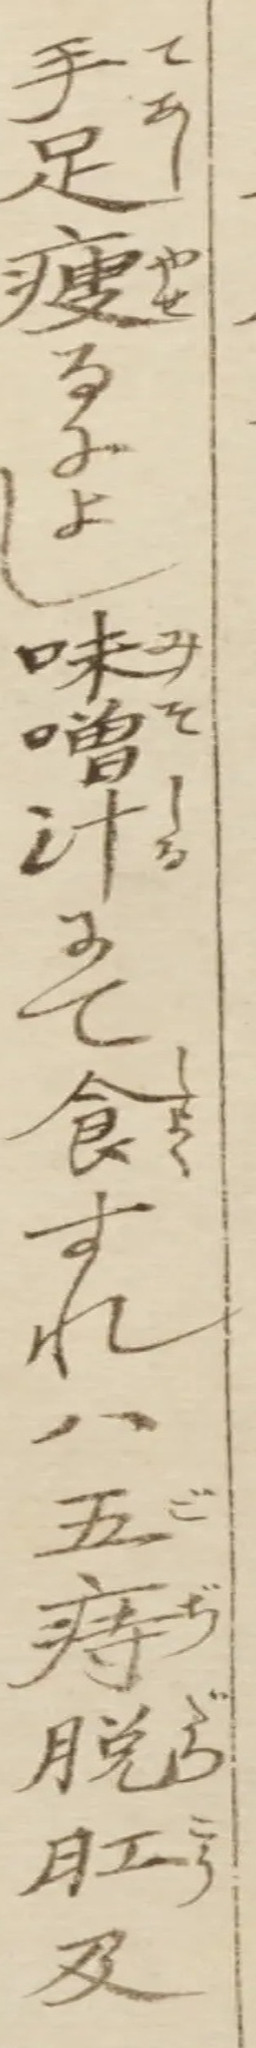手足痩るによし味噌汁にて食すれは五痔脱肛及
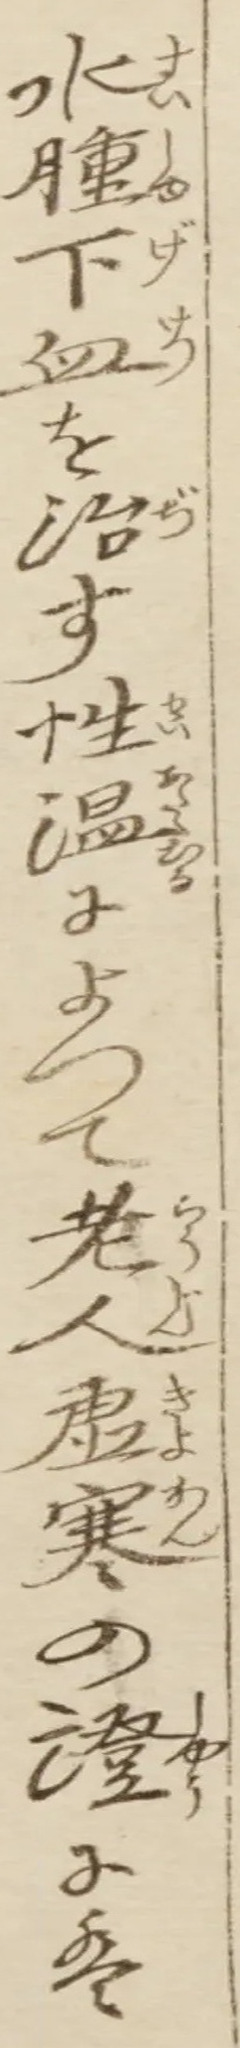水腫下血を治す性温によつて老人虚寒の證には
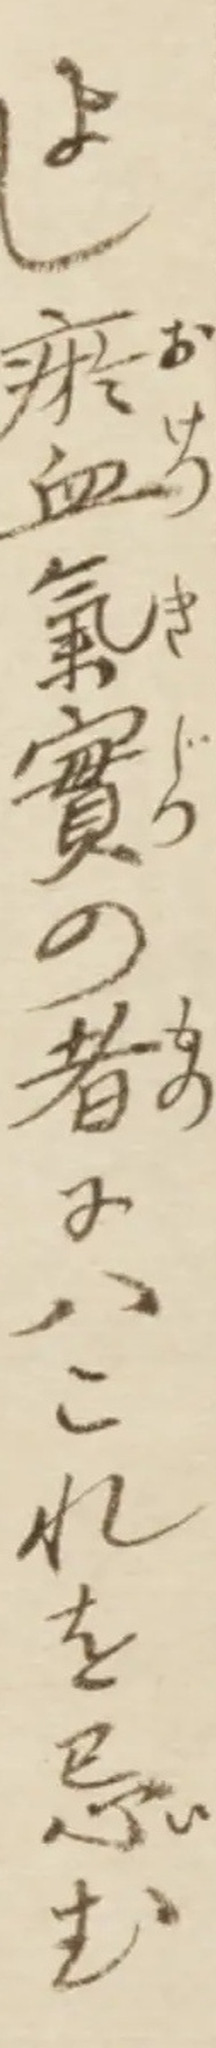よし瘀血気実の者にはこれを忌む
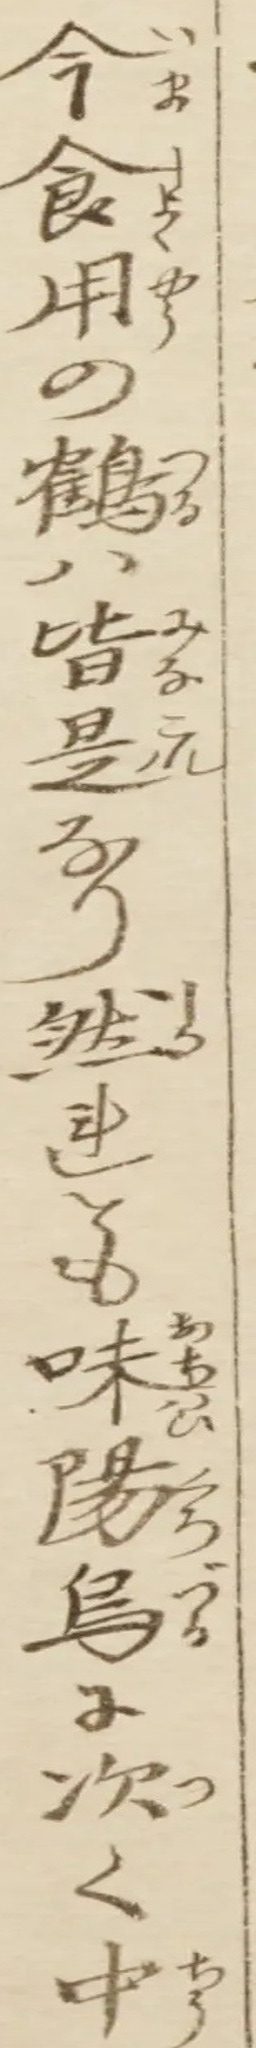今食用の鶴は皆是なり然れとも味陽烏に次く中
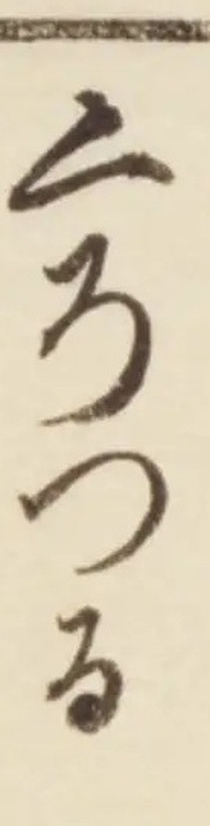くろつる

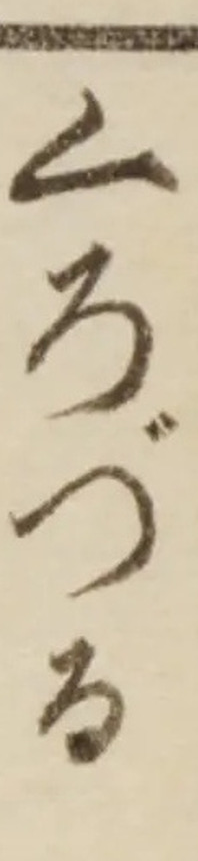くろづる
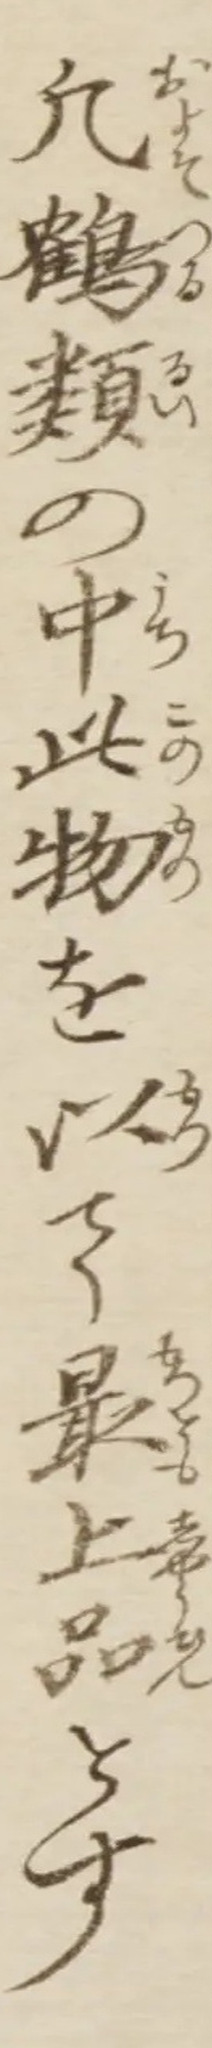凡鶴類の中此物を以て最上品とす
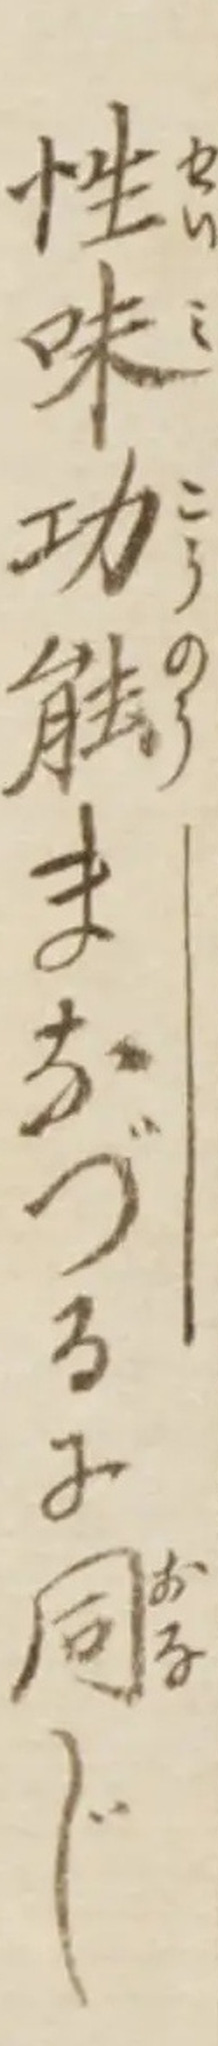性味功能まなづるに同じ
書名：華鳥譜
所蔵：国立国会図書館 National Diet Library, JAPAN
